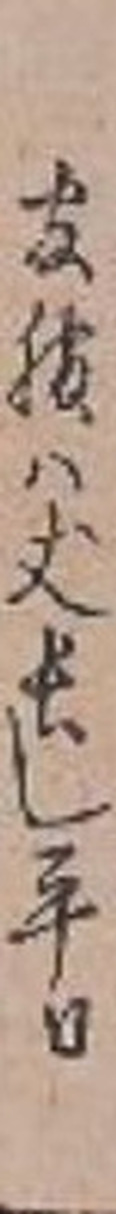官服は丈長し平日
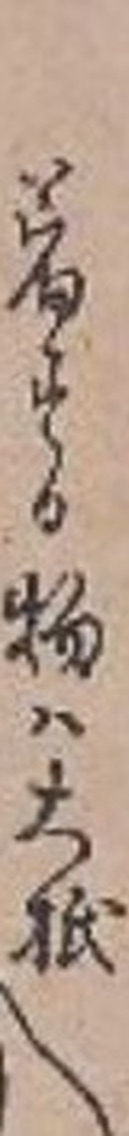着する物は大抵
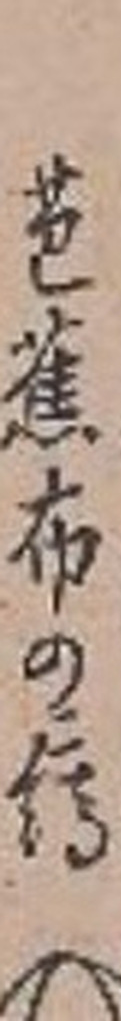芭蕉布の島
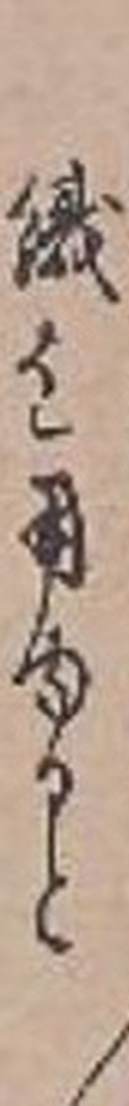織を用ゆると
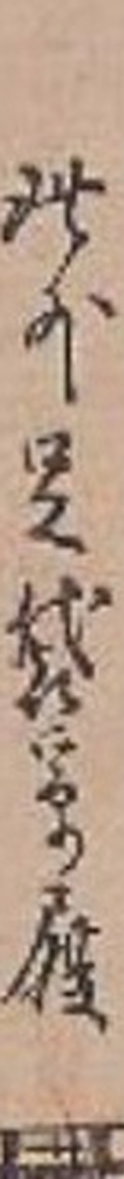此外足袋草履
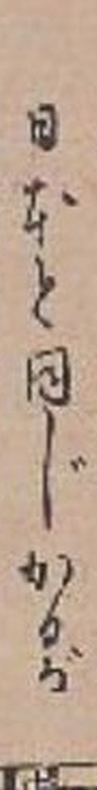日本と同じかるが
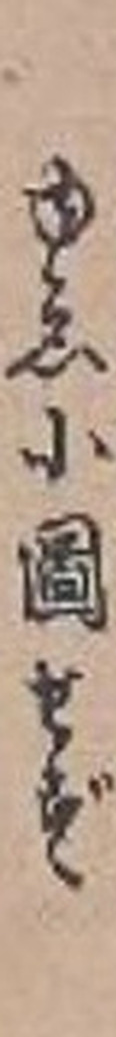ゆゑに図せず
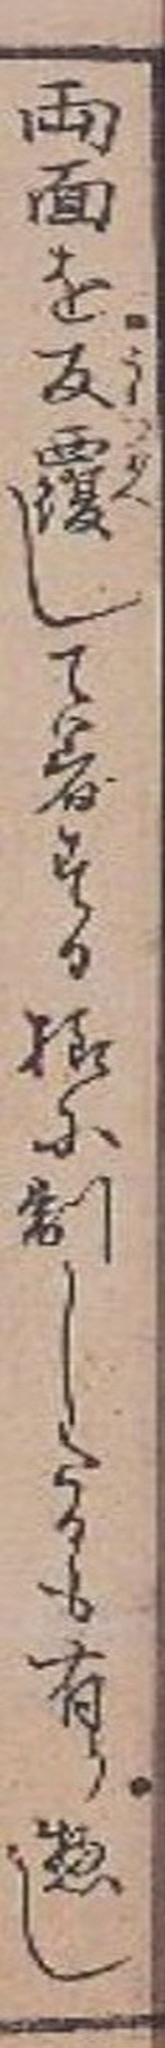両面を反覆して着する様に制したるも有り、惣し
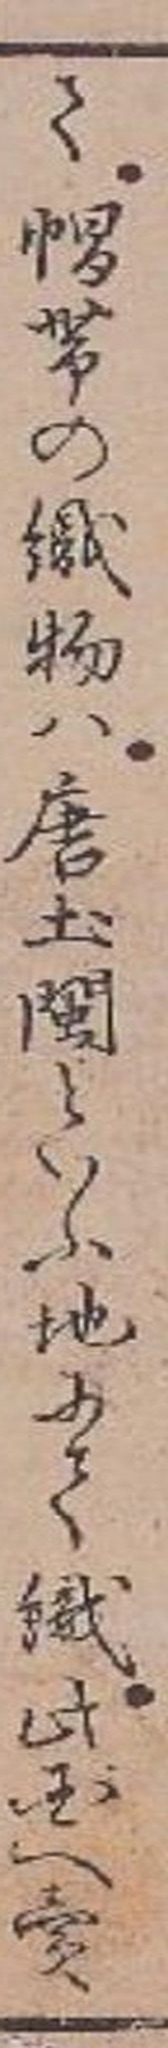て、帽帯の織物は、唐土閩といふ地にて織、此国へ売
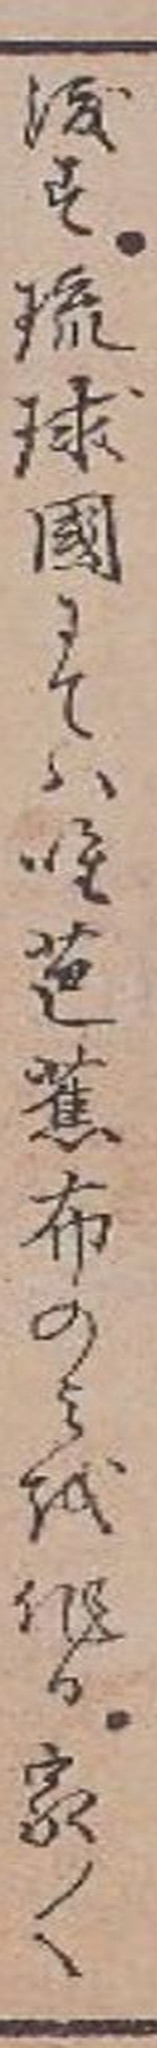渡す、琉球国にては唯芭蕉布のみを作る、家〳〵
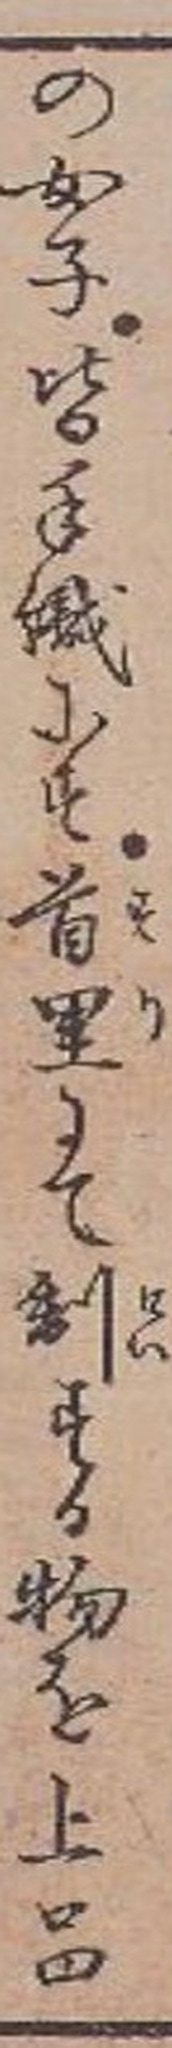の女子、皆手織にす、首里にて制する物を上品
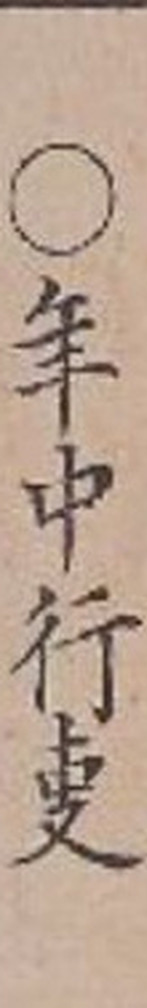○年中行事
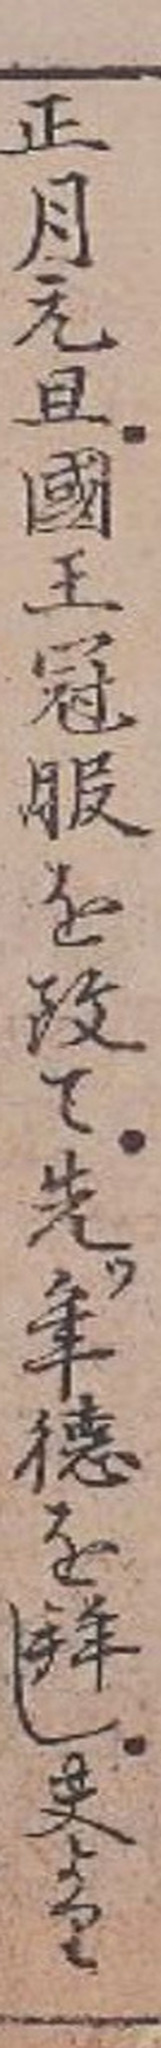正月元旦、国王冠服を改て、先年徳を拝し、夫より
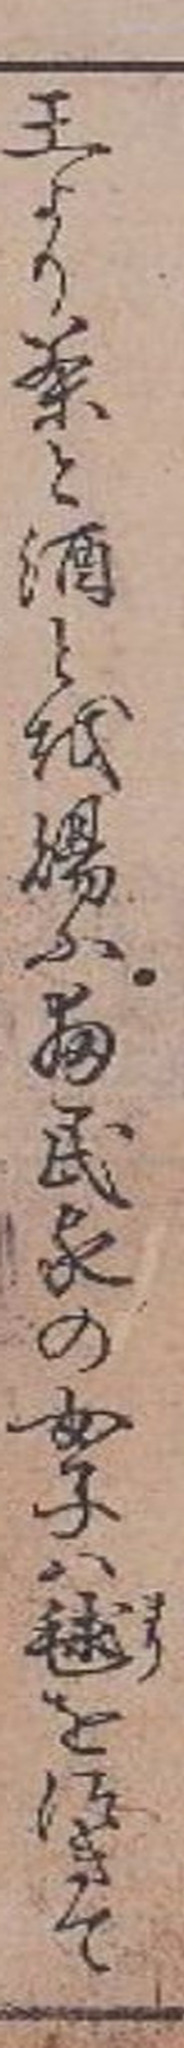王より茶と酒とを賜ふ、扨民家の女子は毬をつきて
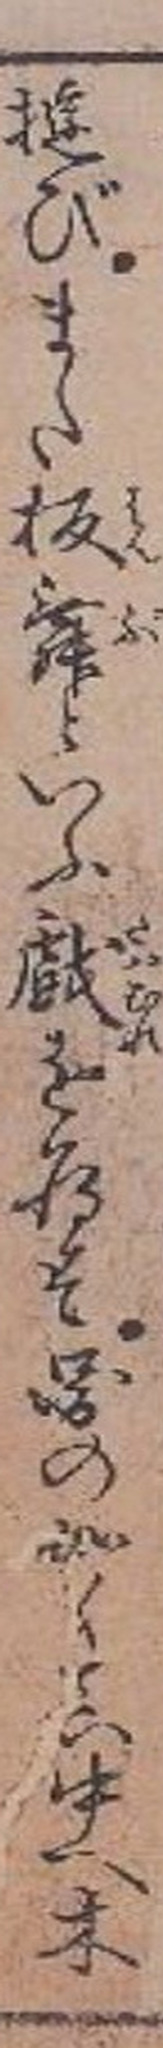遊び、また板舞といふ戯を為す、図の如く真中へ木

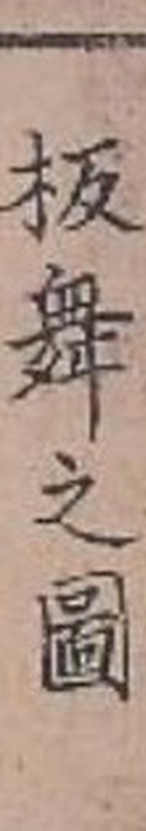板舞之図
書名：琉球談
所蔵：University of the Ryukyus Library
